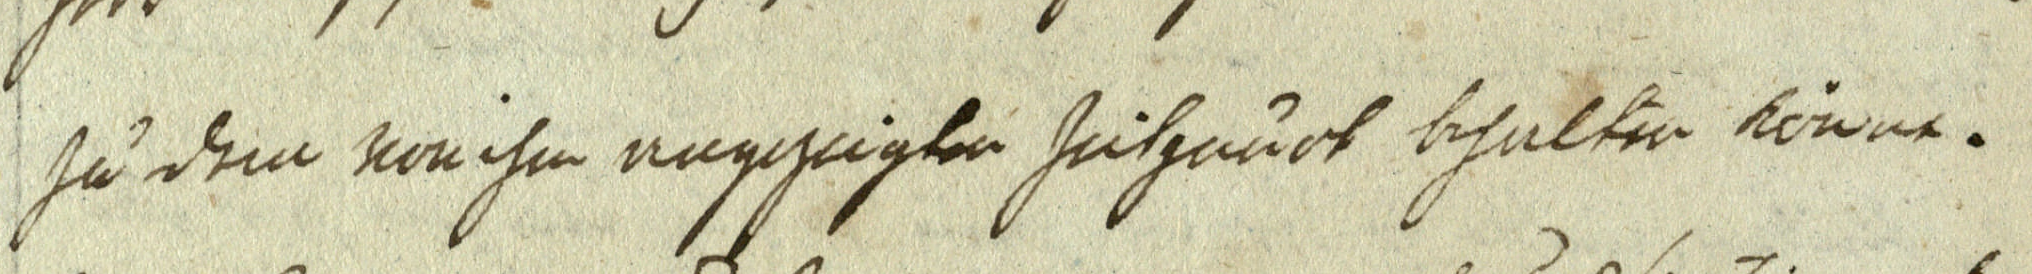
zu dem ihm angezeigten Zeitpunct behalten könne.
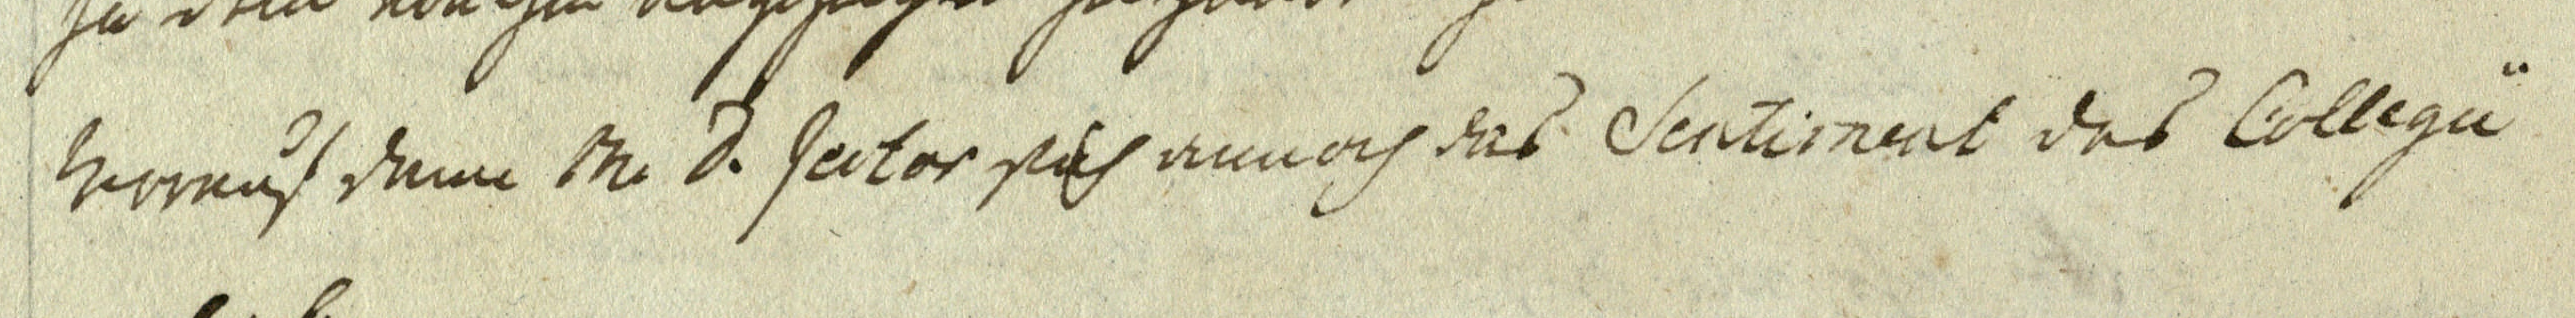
Worauf dem M. D. Rector sich annoch das Sentiment des Collegii
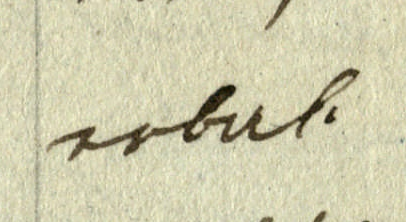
erbat.
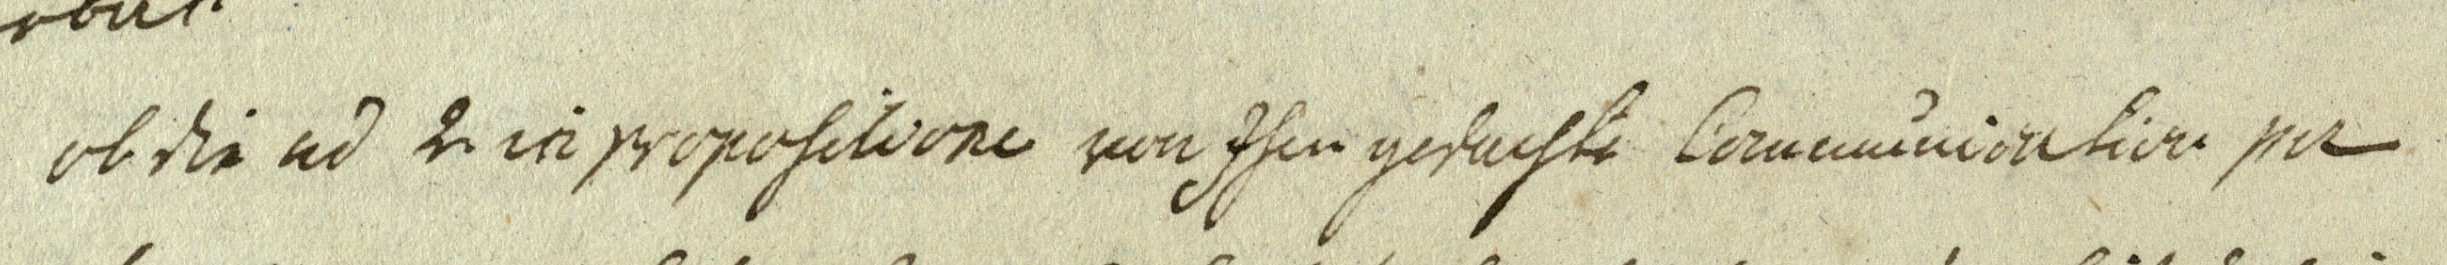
ob die ad 2. in propositione von Ihm gedachte Communication per
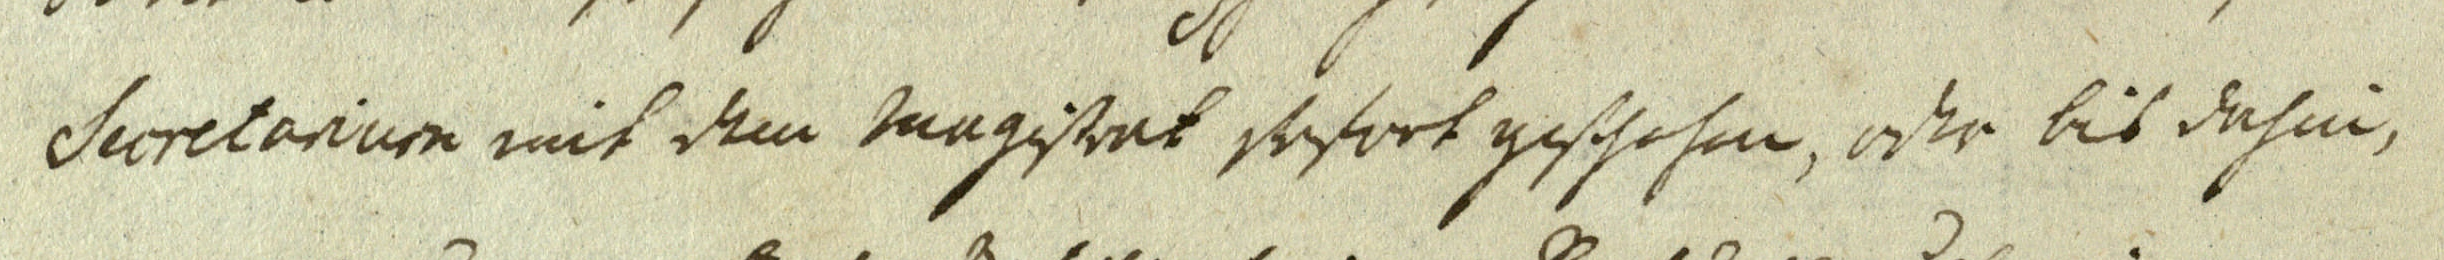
Secretarium mit dem Magistrat sofort geschehen, oder bis dahin,
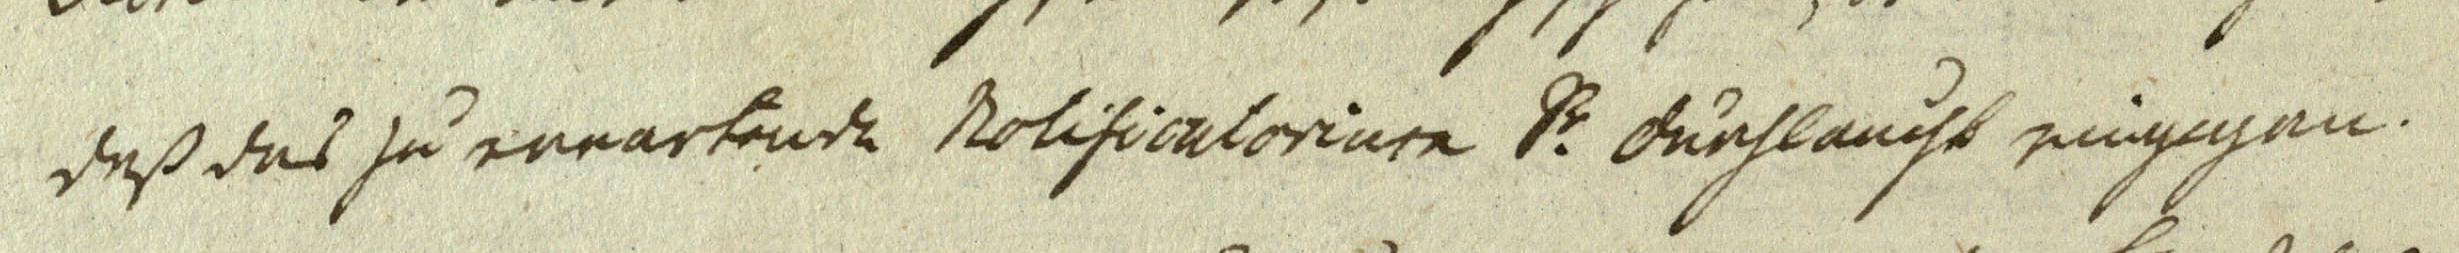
daß das zu erwartende Notificatorium Sr Durchlaucht eingegan¬
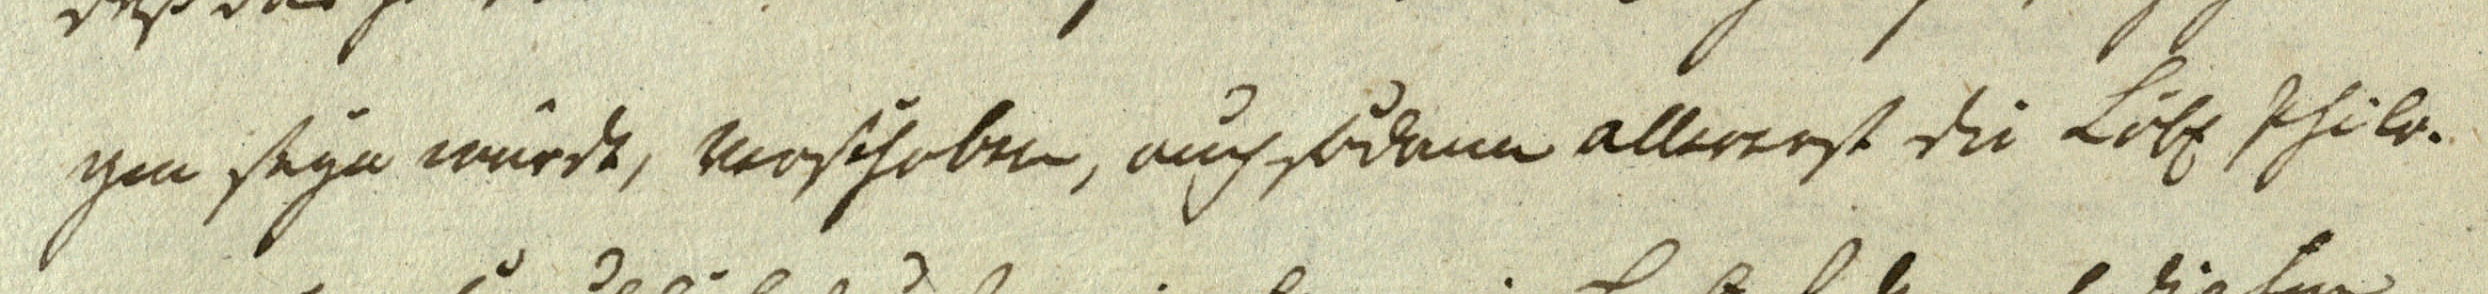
gen seÿn würde, verschoben, auch sodann allererst die Löbl Philo¬
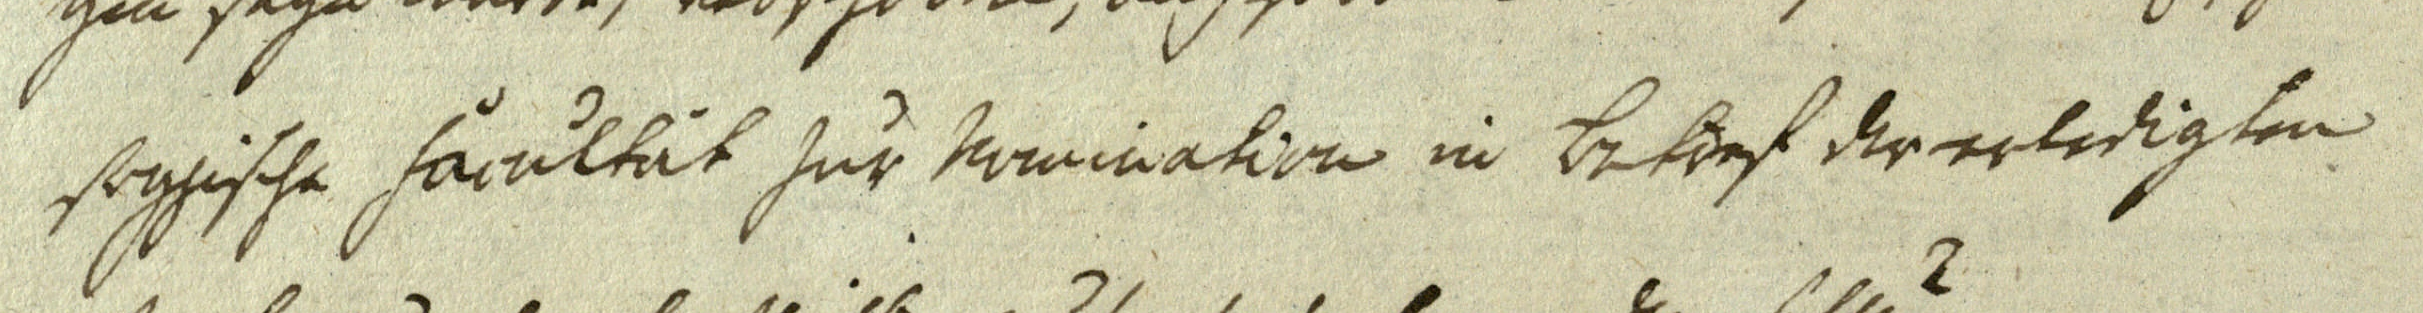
sophische Facultät zur Nomination in Betref der erledigten
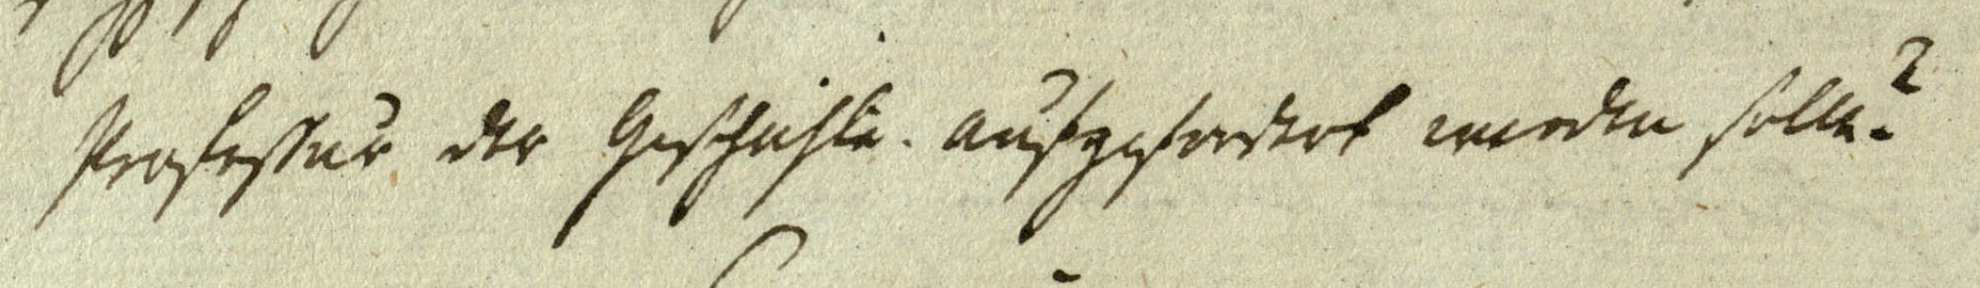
Professur der Geschichte. aufgefordert werden solle?
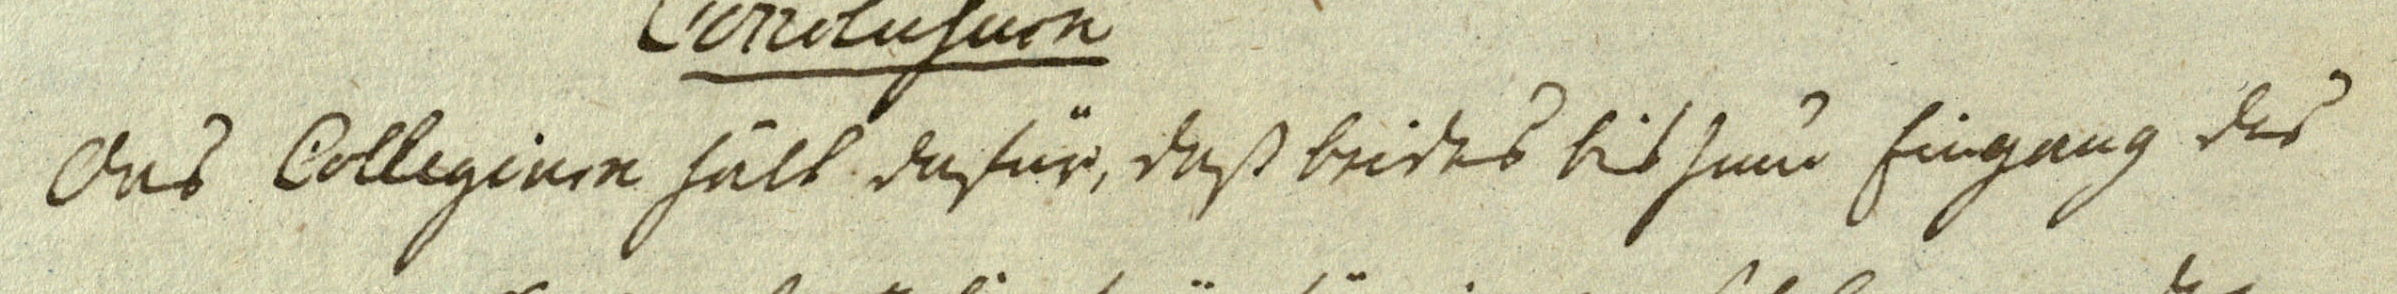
Das Collegium hält dafür, daß beides bis zum Eingang des
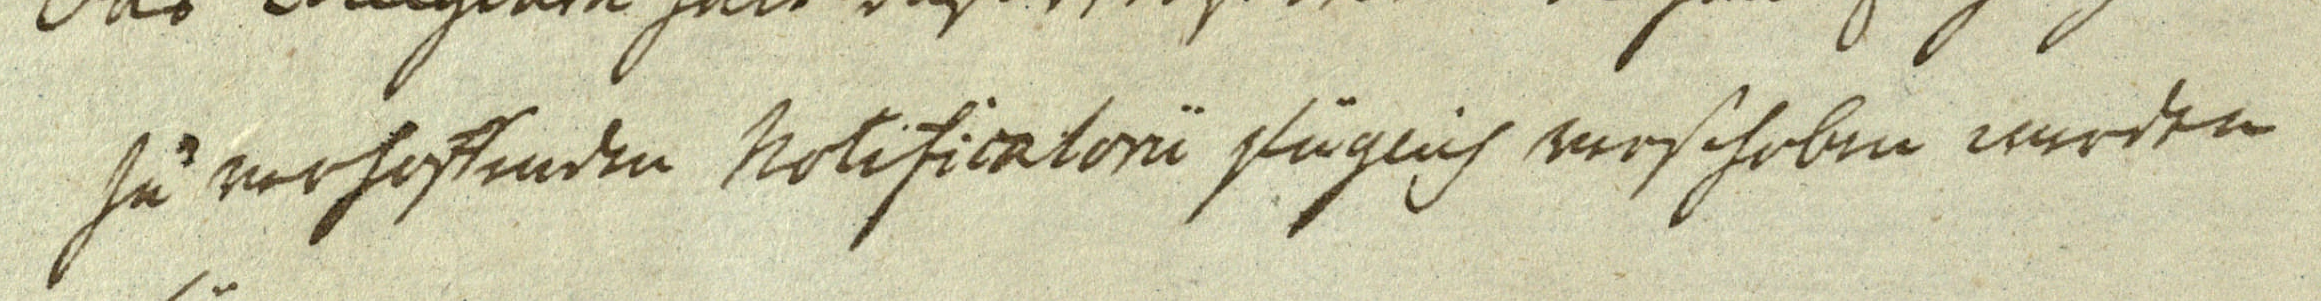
zu verhoffenden Notificatorii füglich verschoben werden
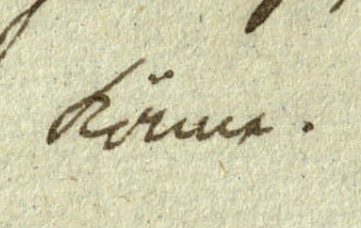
könne.
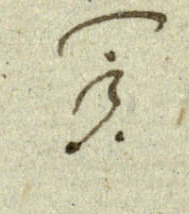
3.
